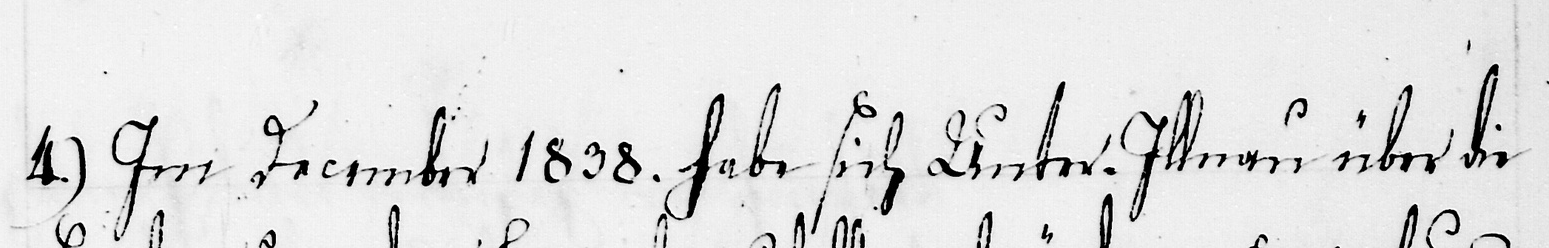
4.) Im December 1838. habe sich Unter-Illnau über die
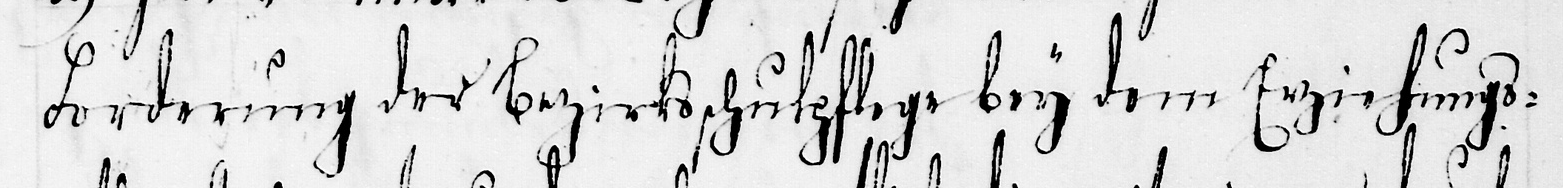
Forderung der Bezirksschulpflege bey dem Erziehungs¬
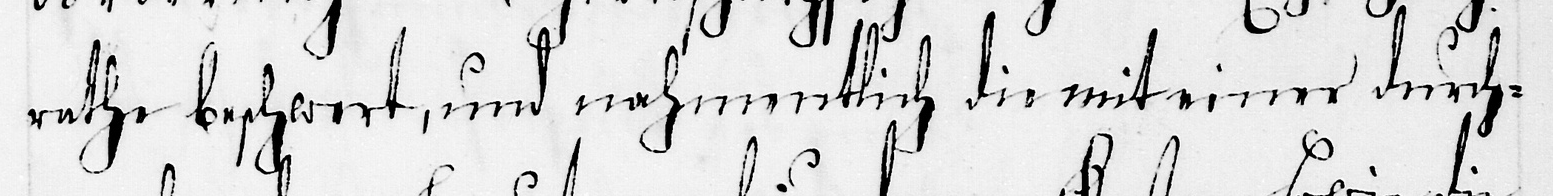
rathe beschwert, und nahmentlich die mit einer durch¬
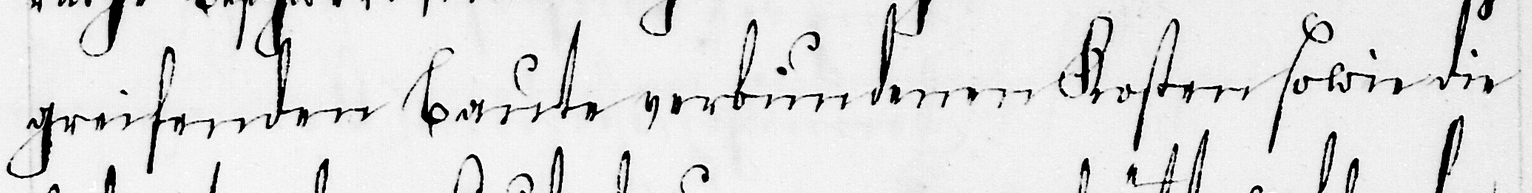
greifenden Baute verbundenen Kosten sowie die
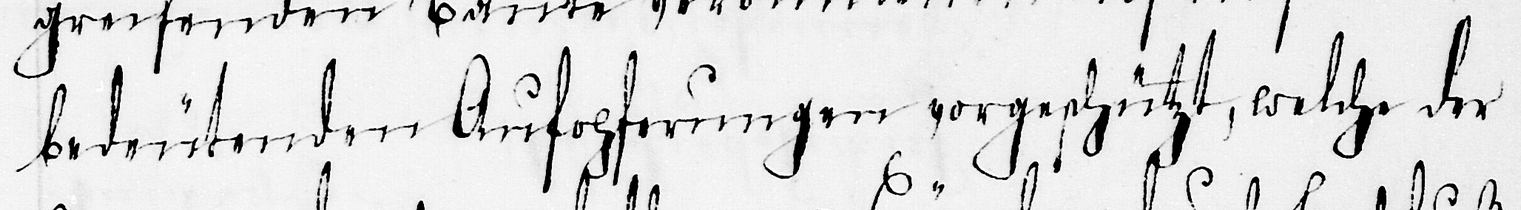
bedeutenden Aufopferungen vorgeschützt, welche der
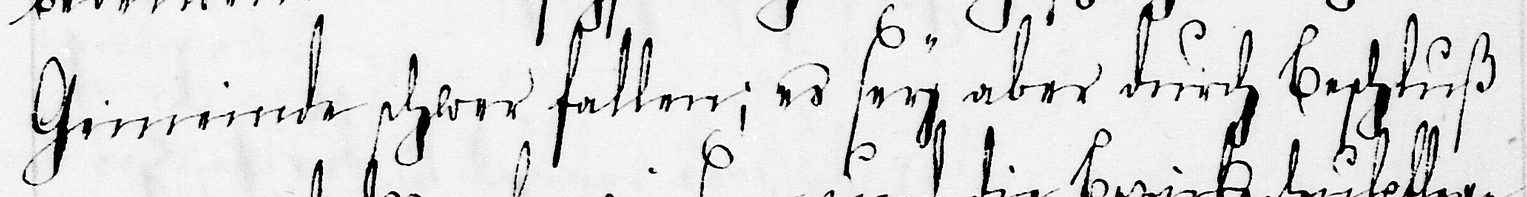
Gemeinde schwer fallen; es sey aber durch Beschluß
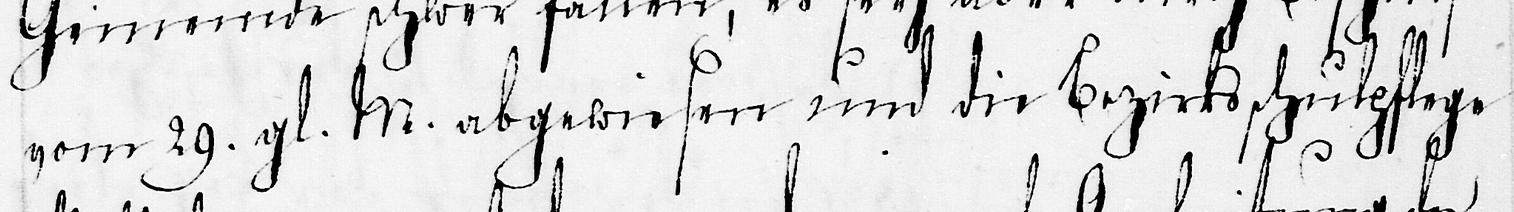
vom 29. gl. M. abgewiesen und die Bezirksschulpflege
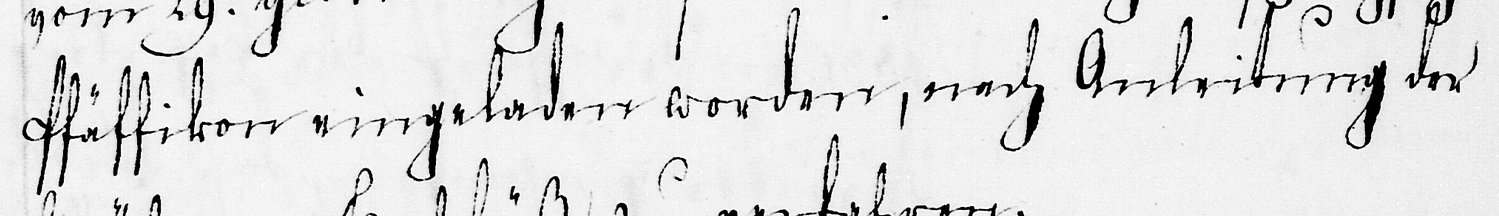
Pfäffikon eingeladen worden, nach Anleitung der
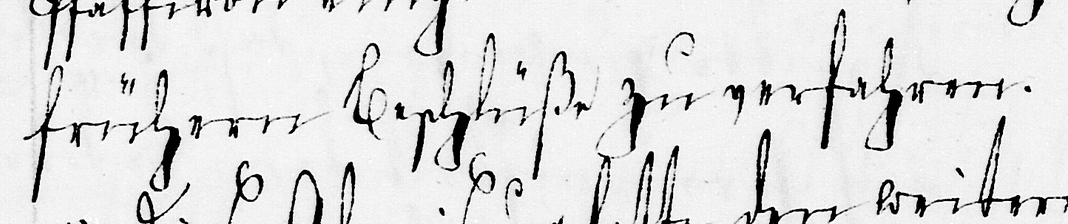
frühern Beschlüße zu verfahren.
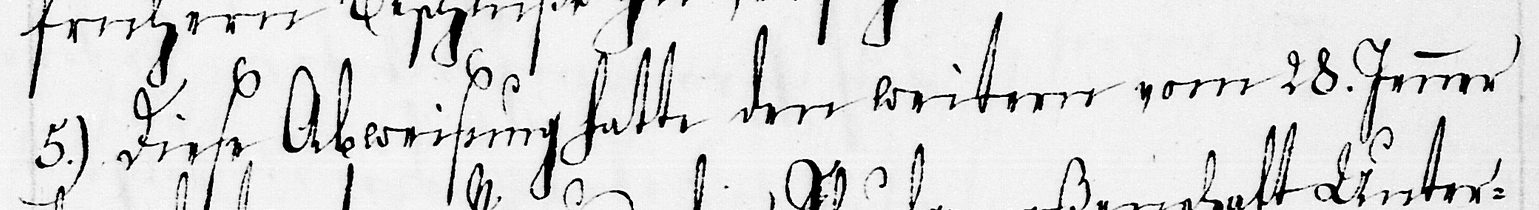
5.) Diese Abweisung hatte den weitern vom 28. Jenner
